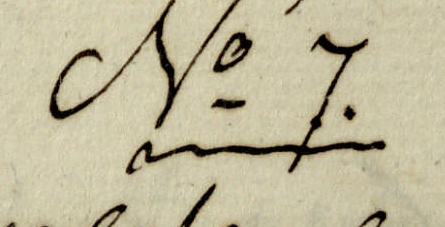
No 7.
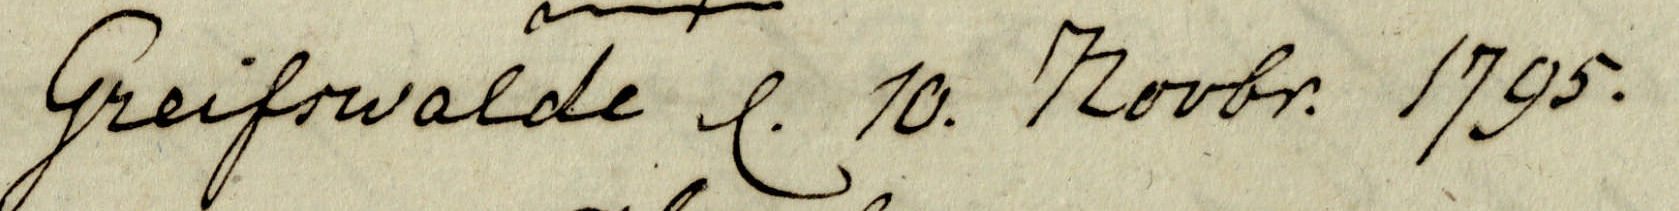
Greifswalde d. 10. Novbr. 1795.
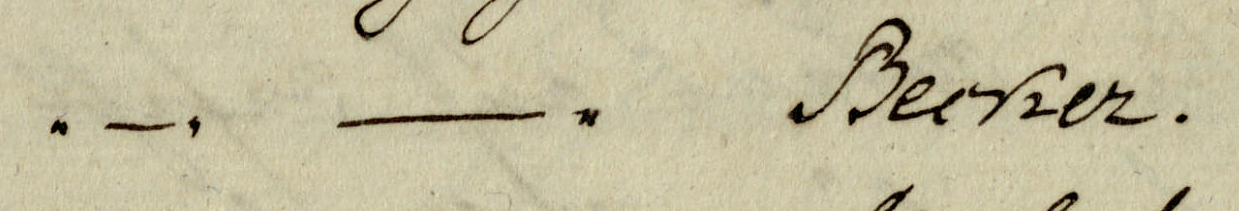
" — " — " Becker.
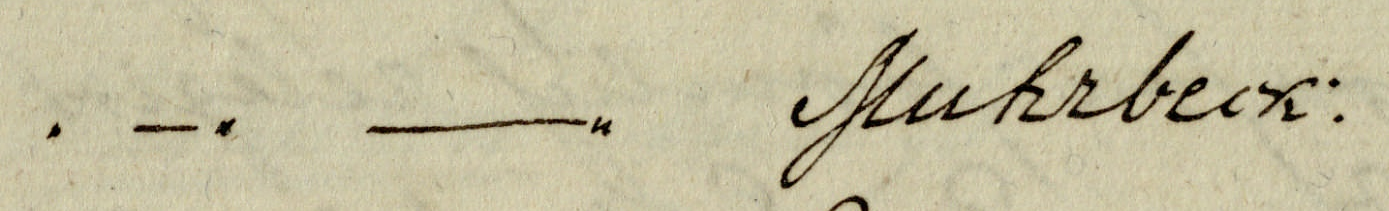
" — " — " Muhrbeck.
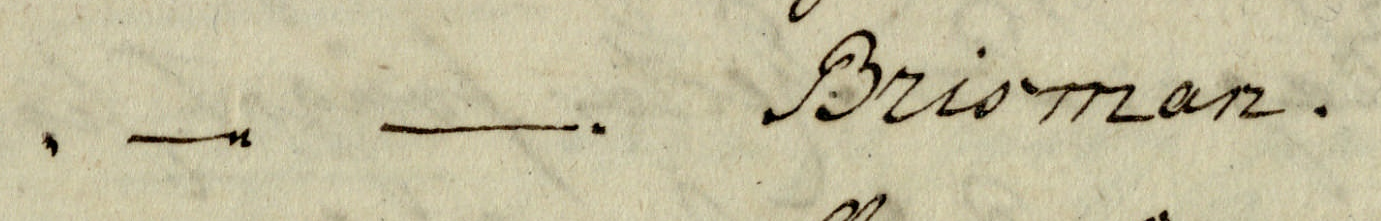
" — " — " Brisman.
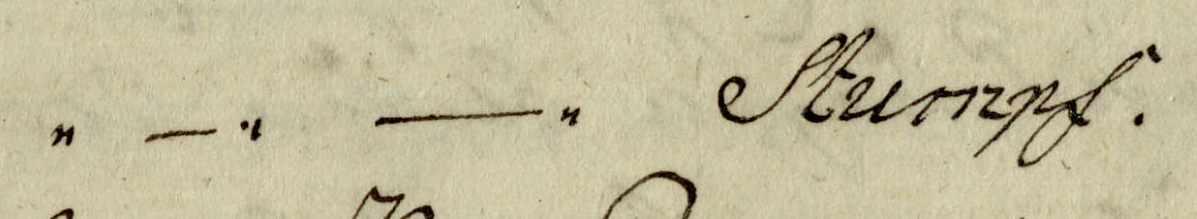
" — " — " Stumpf.
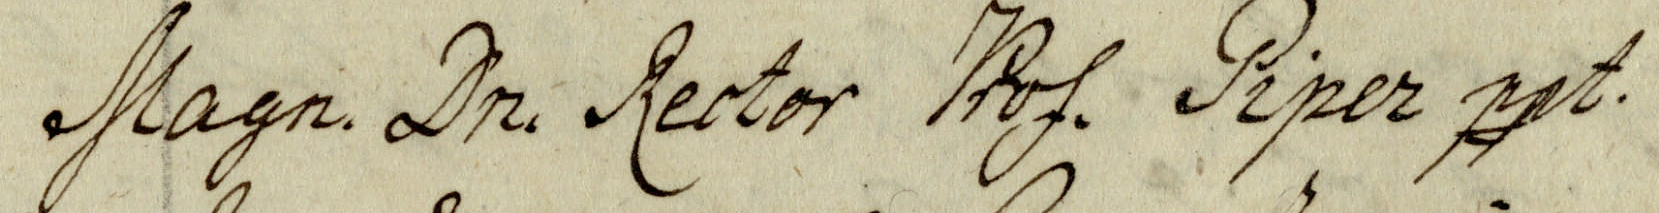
Magn. Dn. Rector Prof. Piper ppt.
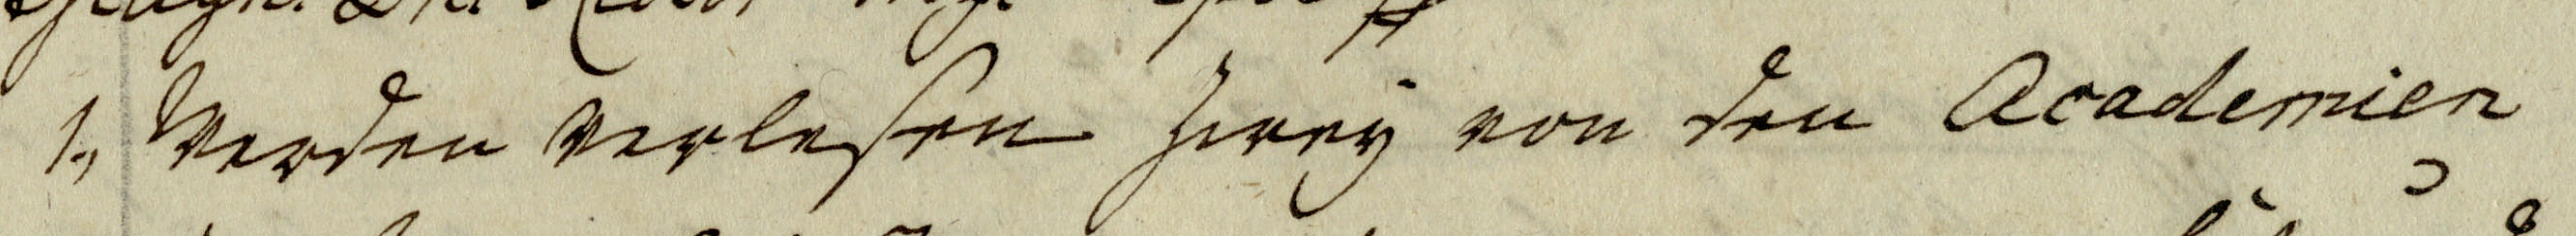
1., Werden verlesen zweÿ von den Academien
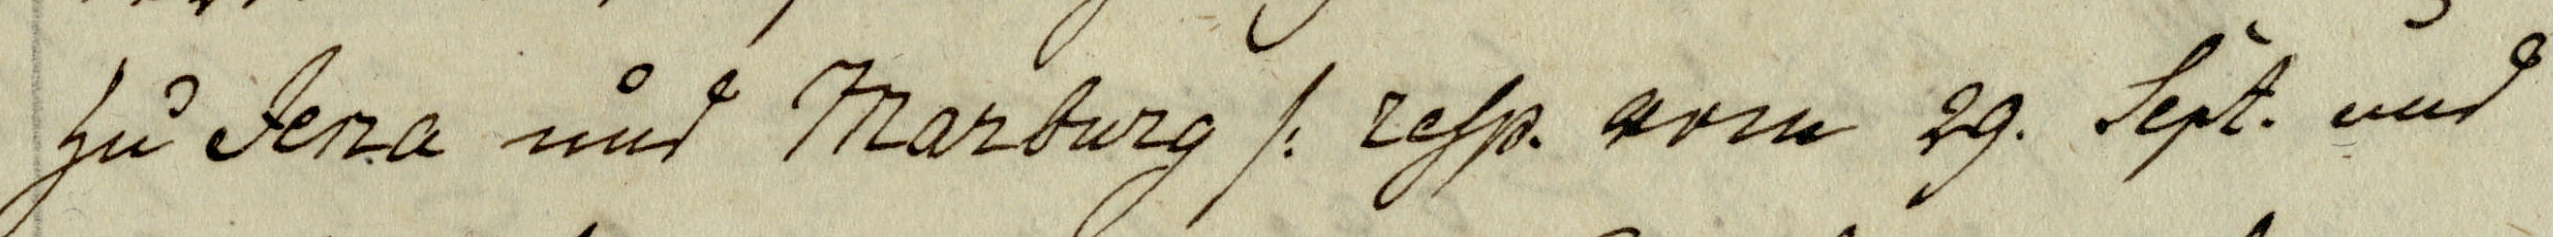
zu Jena und Marburg /: resp. vom 29. Sept. und
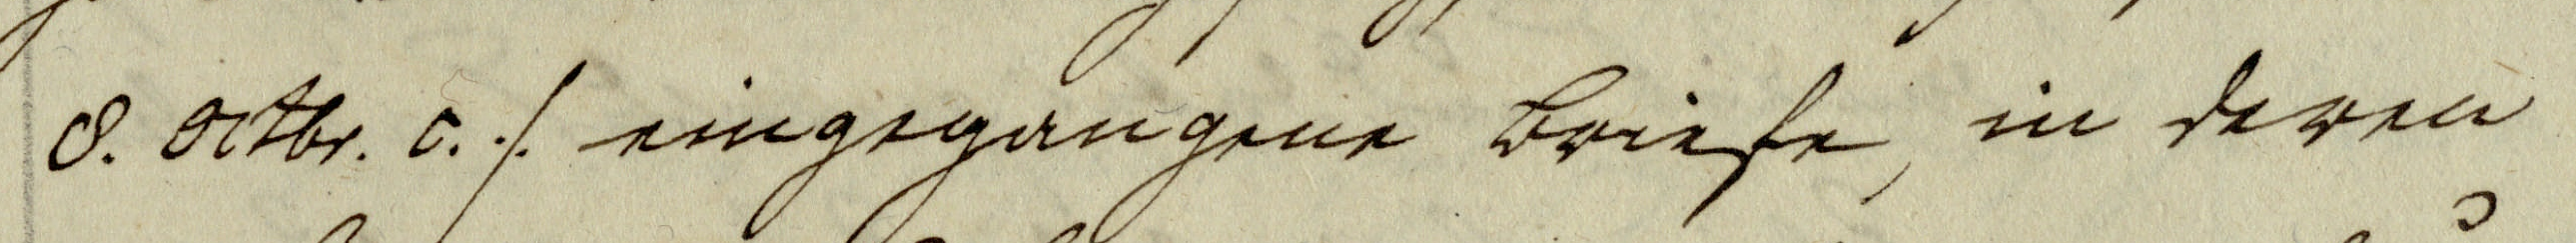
8. Octbr. c. ./. eingegangene Briefe, in deren
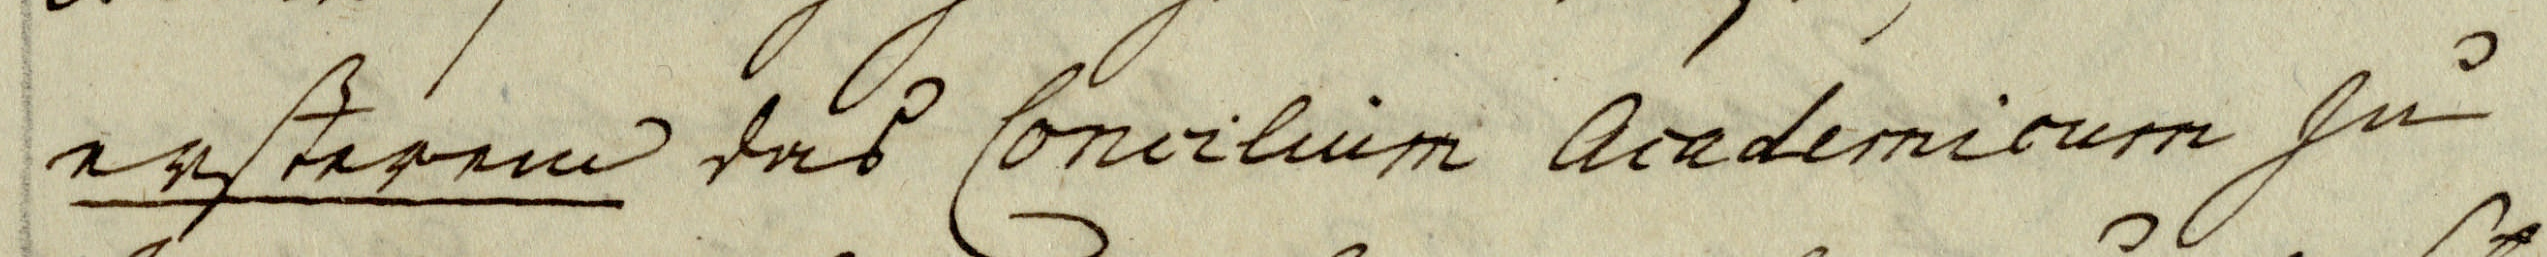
ersterem das Concilium Academicum zu
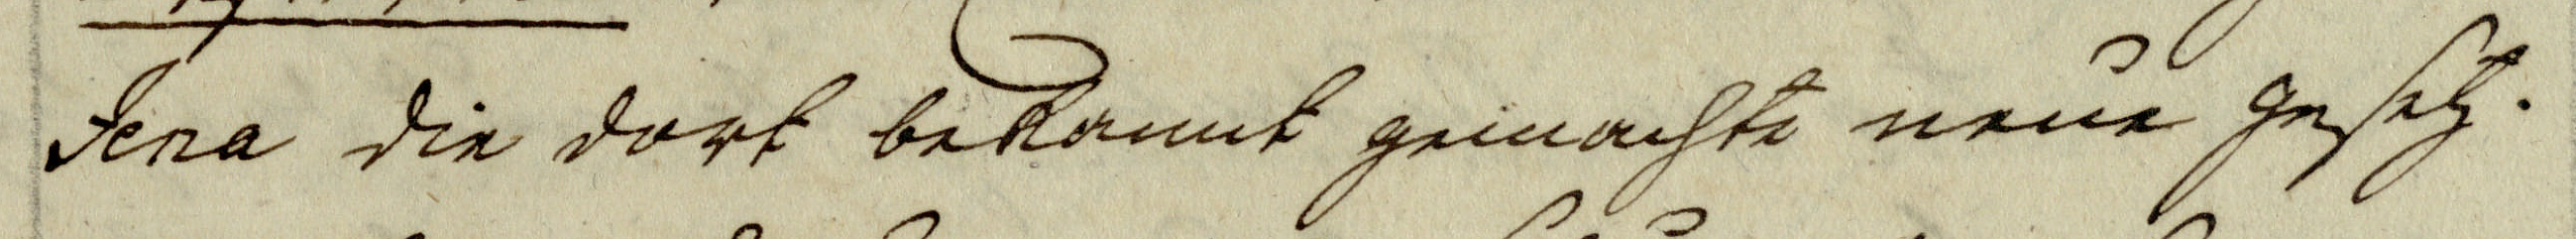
Jena die dort bekannt gemachte neue gesetz¬
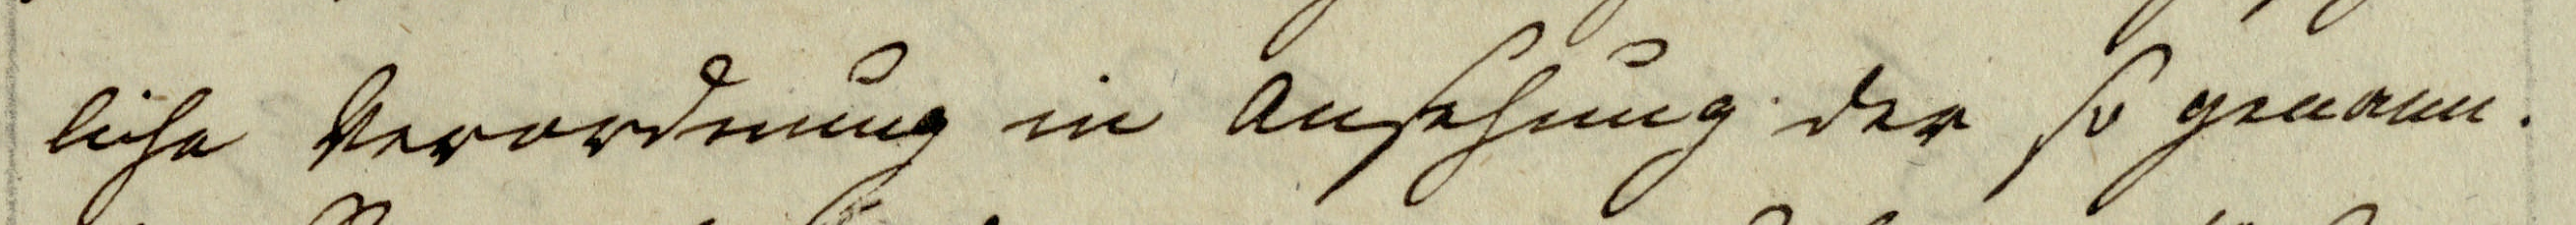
liche Verordnung in Ansehung der so genann¬
